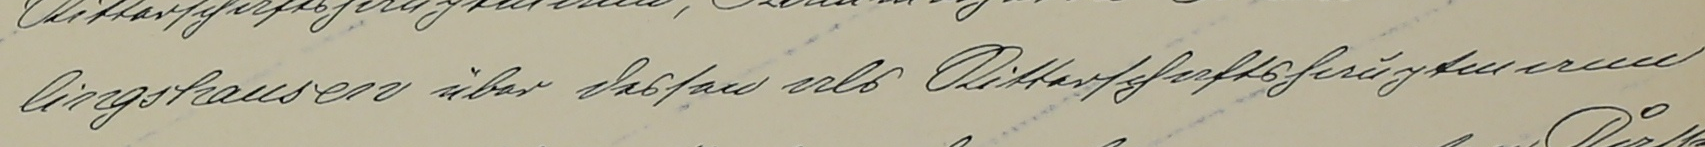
lingshausen über dessen als Ritterschaftshauptmann
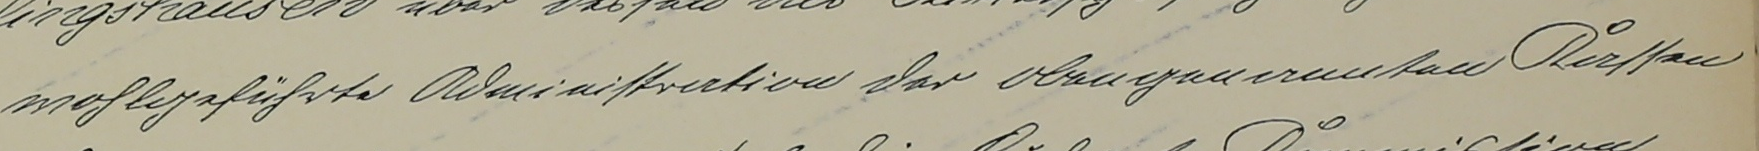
wohlgeführte Administration der obengenannten Kassen
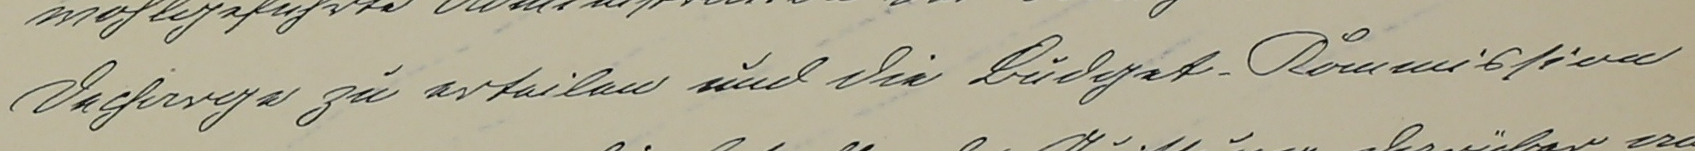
Decharge zu erteilen und die Budget-Kommission
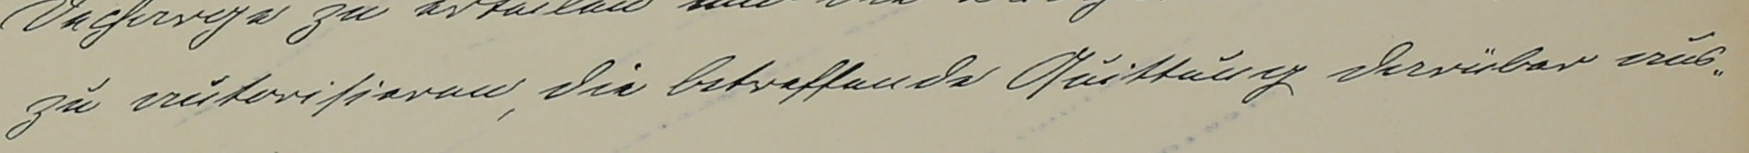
zu autorisieren, die betreffende Quittung darüber aus-
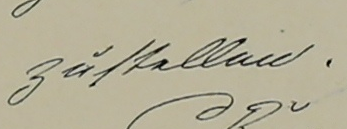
zustellen.
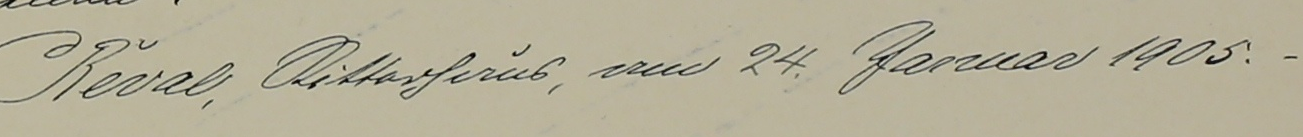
Reval, Ritterhaus, am 24. Januar 1905.
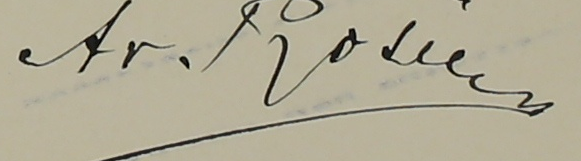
A. v. Rosen
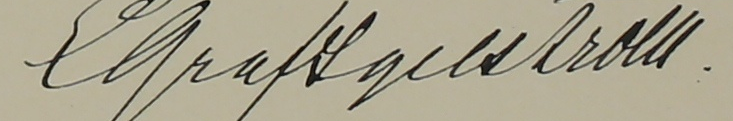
E. Graf Igelstrom
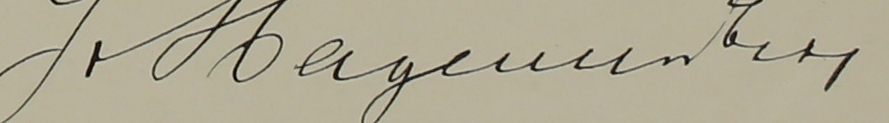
J. v. Hagemeister
